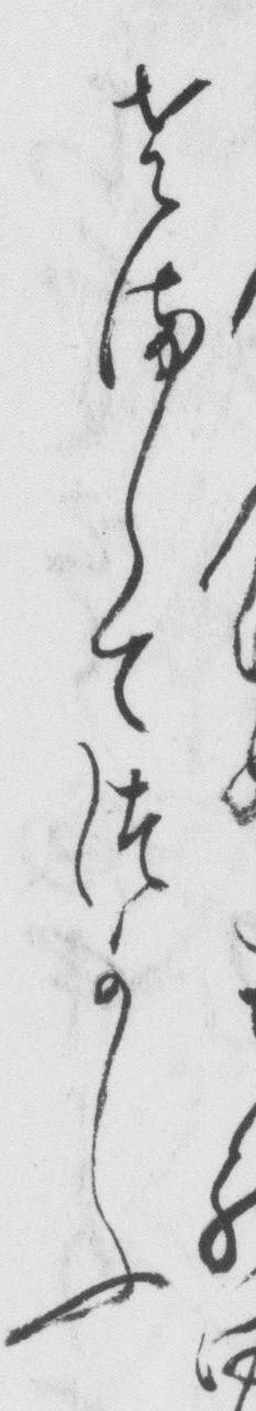ましてつかふ
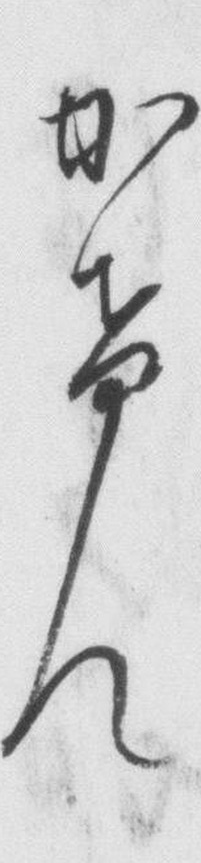かけん
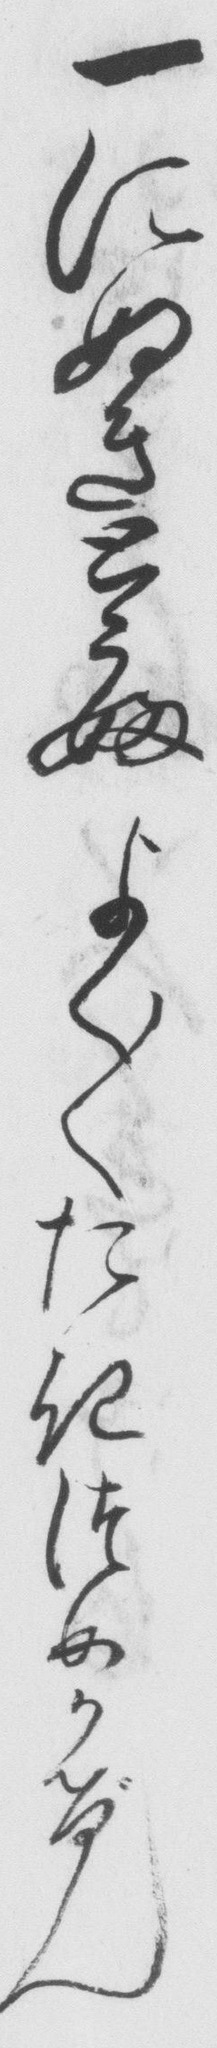一にぬきとうふよく〳〵たきつにめる也
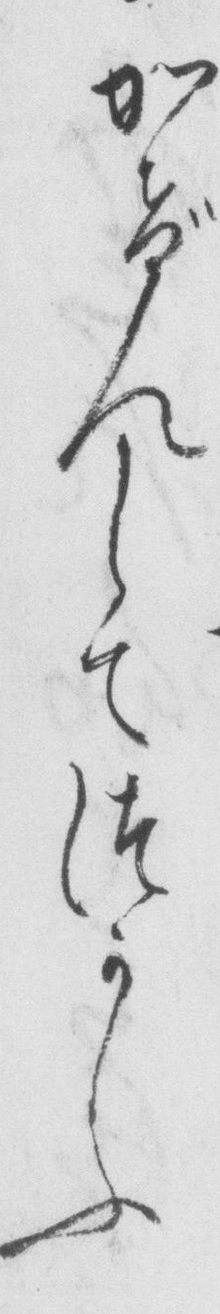かげんしてつかふ

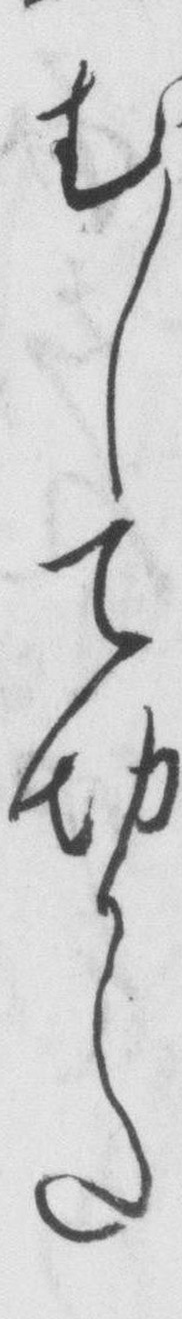むして切りかた
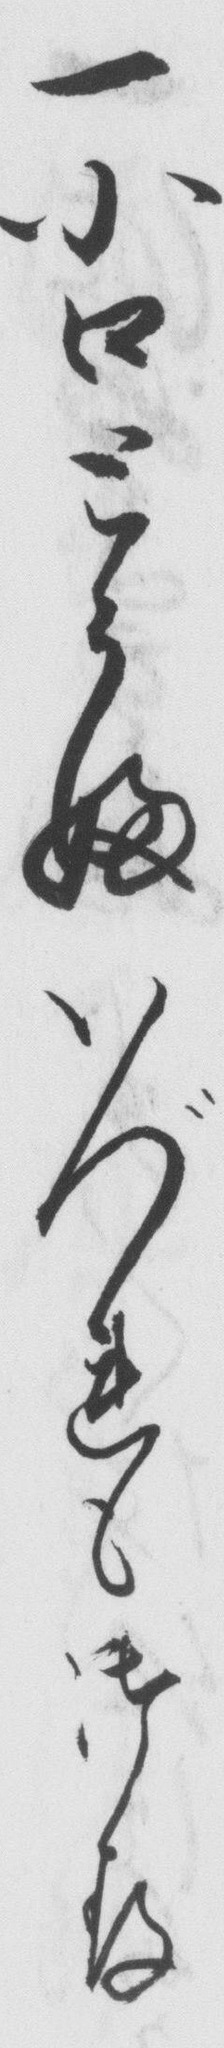一小口とうふいづれもつ
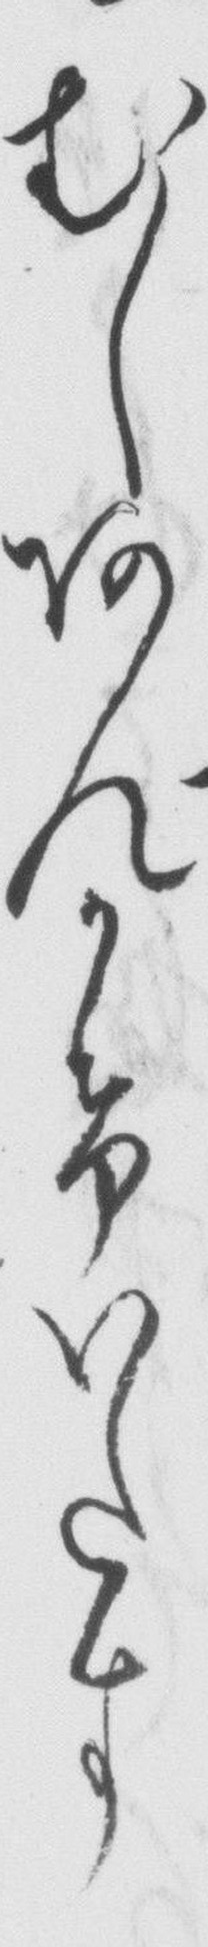むしあんかけいたす
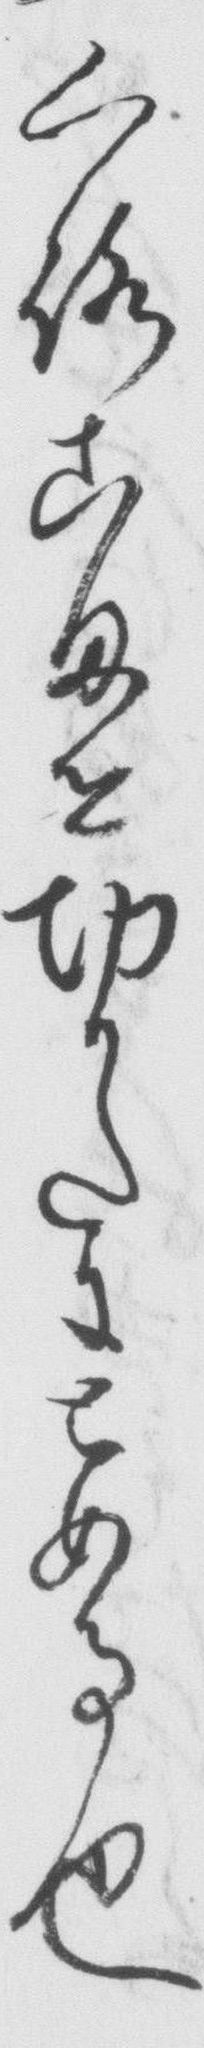くろこまを切かたにる也
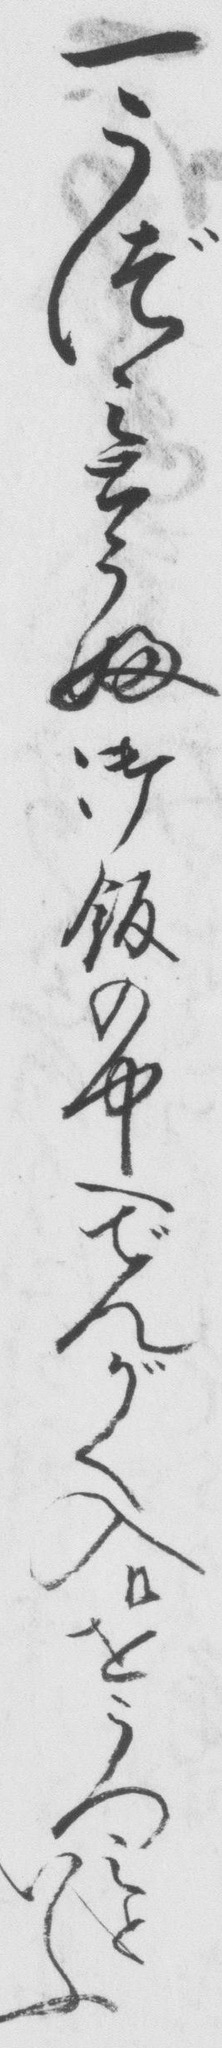一うづミとうふ御飯の中へでんがく入ルをうつミと
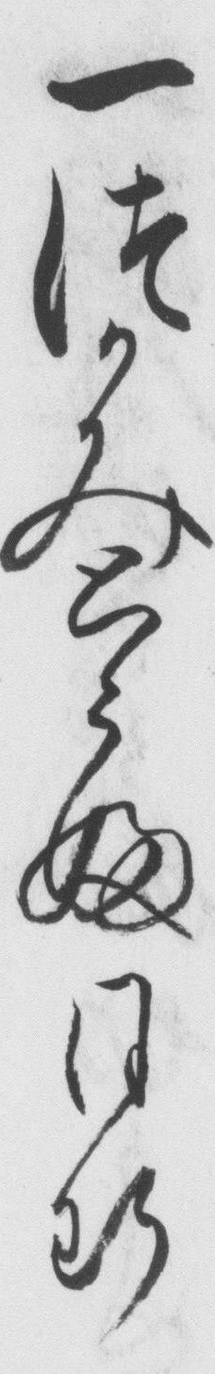一つかみとうふ同段

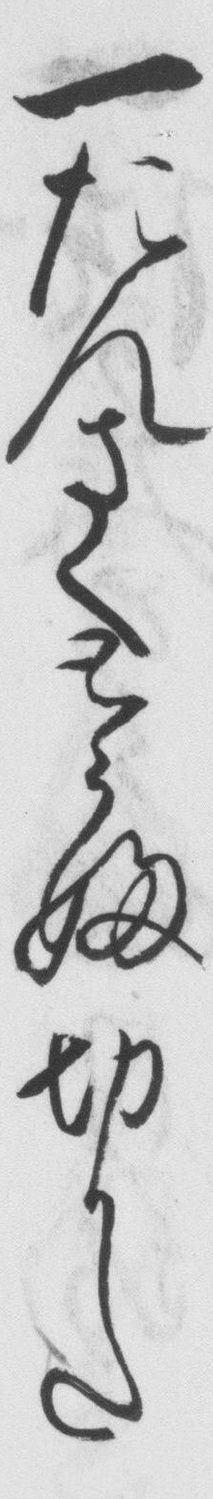一たんさくとうふ切かた
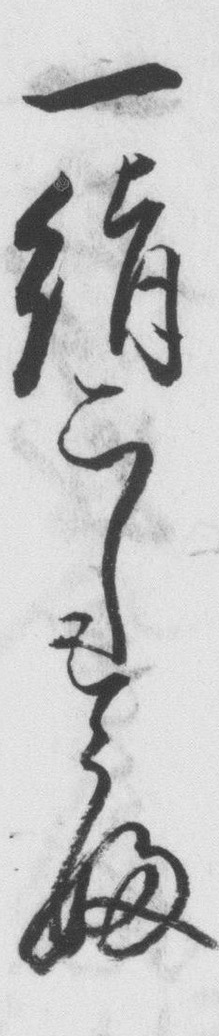一絹こしとうふ
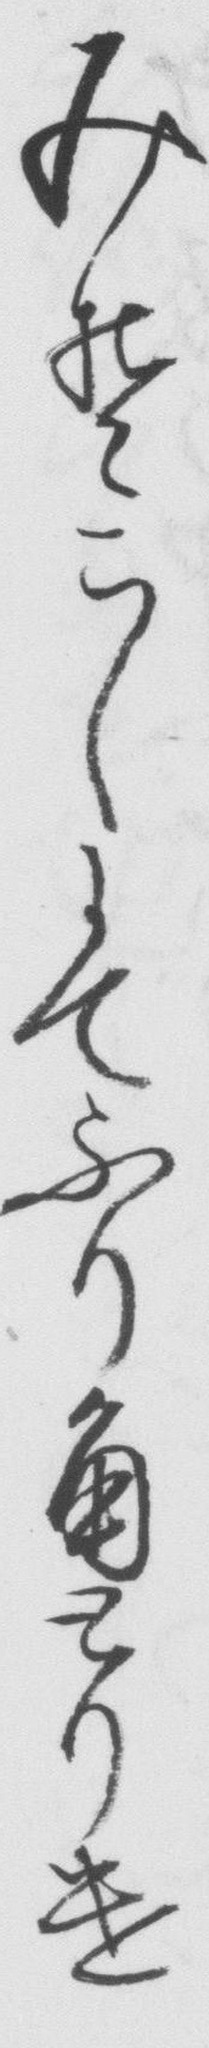みのかミこしにてふり角とり遣
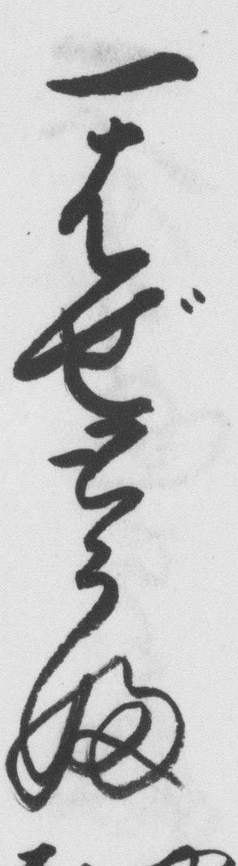一青豆とうふ
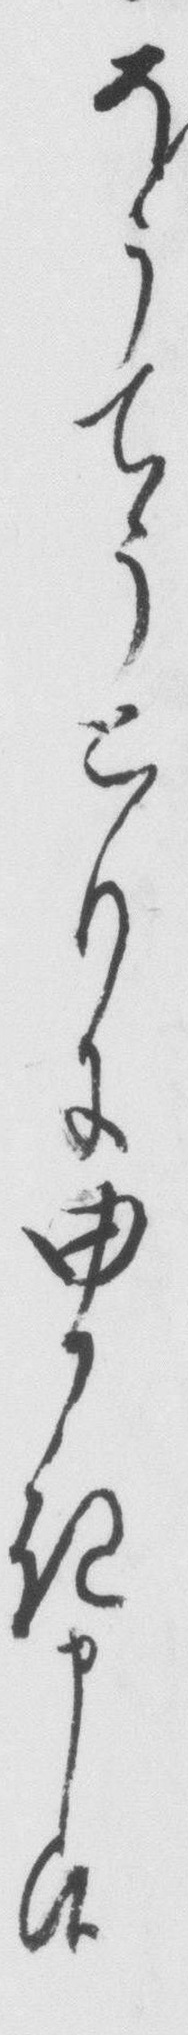ほうてうとりにゆかき
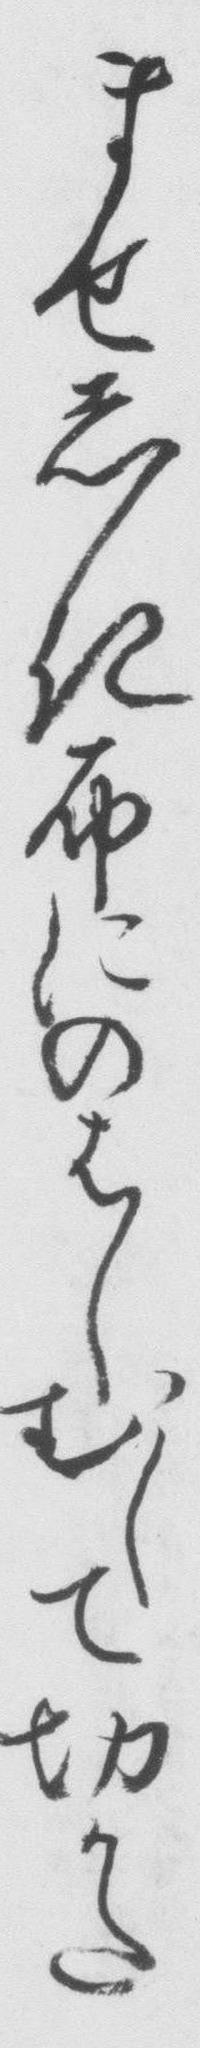ませしき布にのはしてむして切かた
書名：料理筌
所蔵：大阪府立大学学術情報センター 国文学研究資料館
